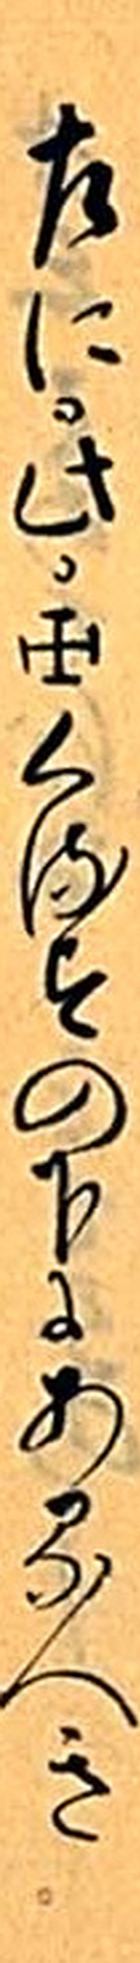左に◦此◦☩くるすの下にあるへき
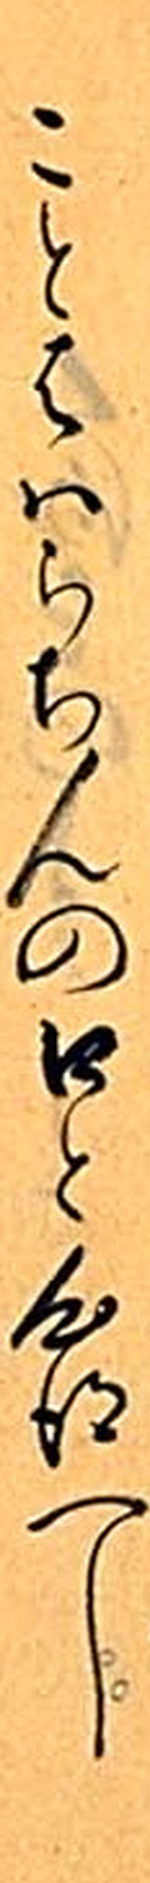ことははらちんの口と心得へし
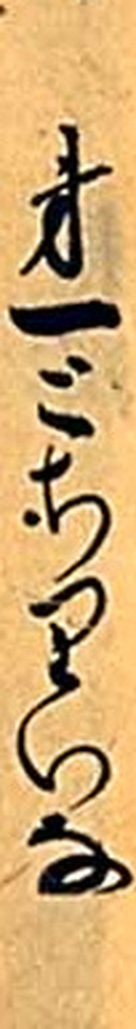第一とちりいな
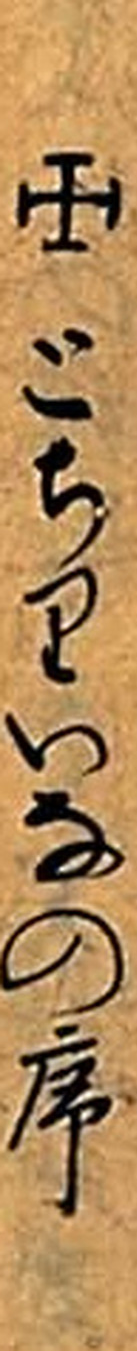☩とちりいなの序
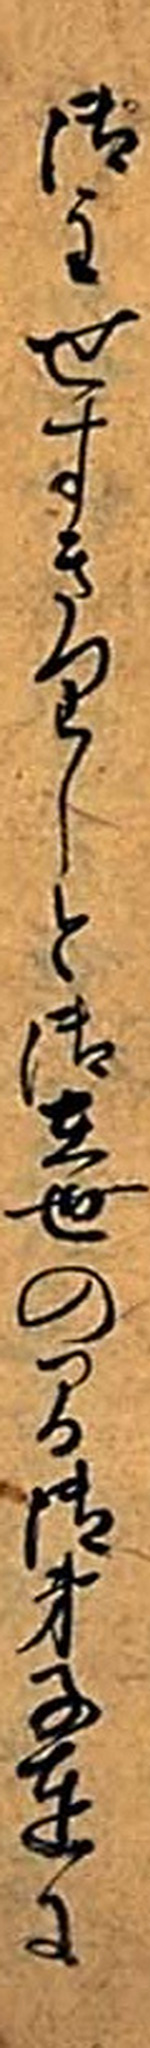御主せすきりしと御在世の間御弟子達に
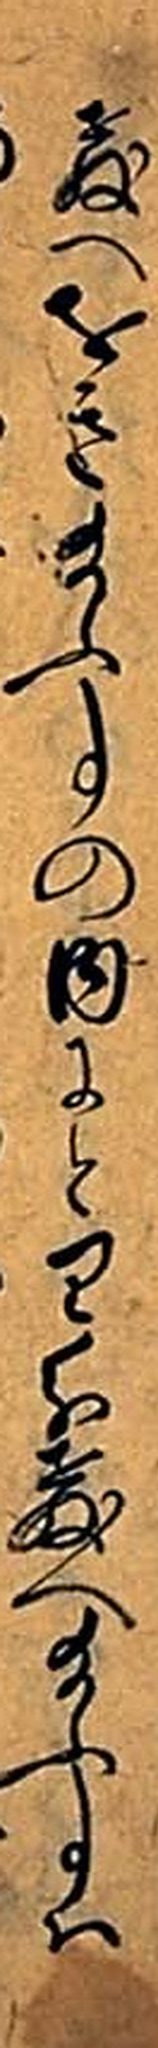教へをき給ふ事の内にとり分教へ給ふ事は
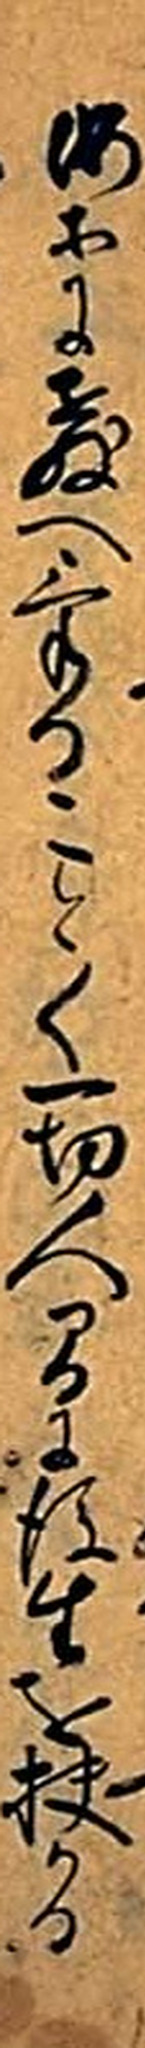汝等に教へけることく一切人間に後生を扶かる
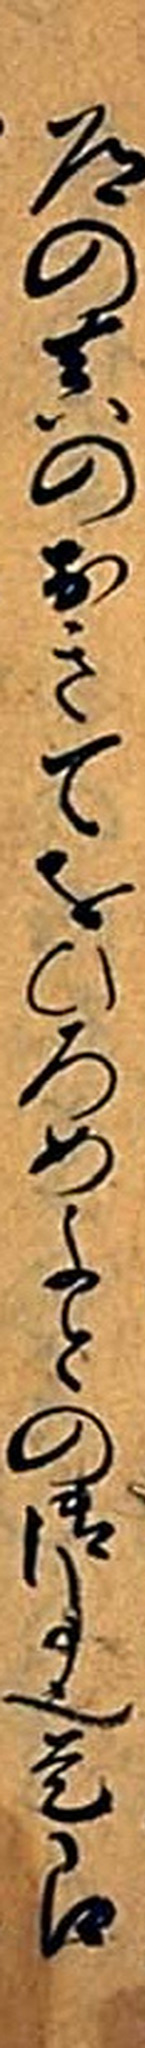道の真のおきてをひろめよとの御事也是即
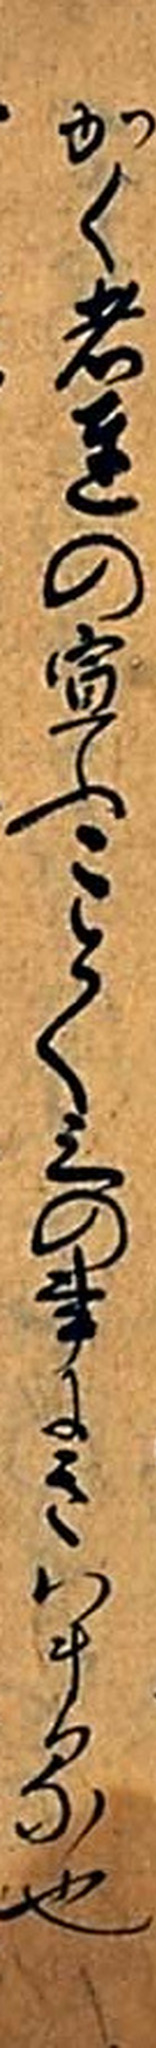かく者達の宣ふことく三の事にきはまる也
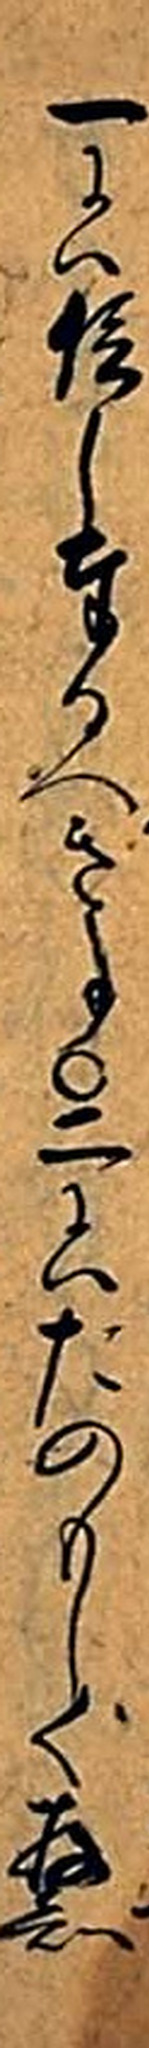一には信し奉るへき事○二にはたのもしく存知
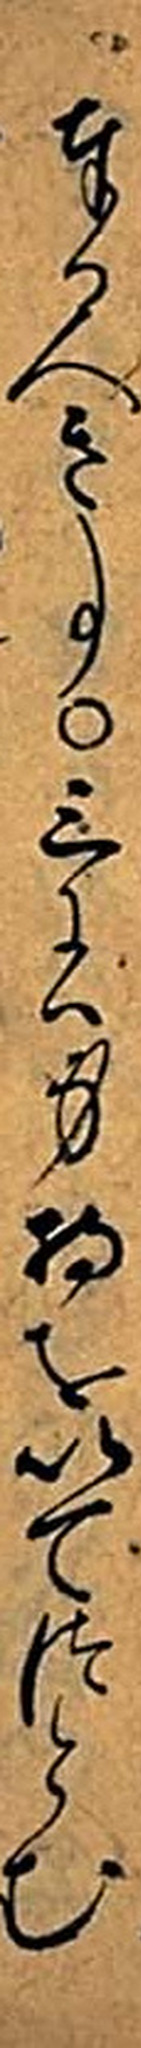奉るへき事○三には身持を以てつとむ
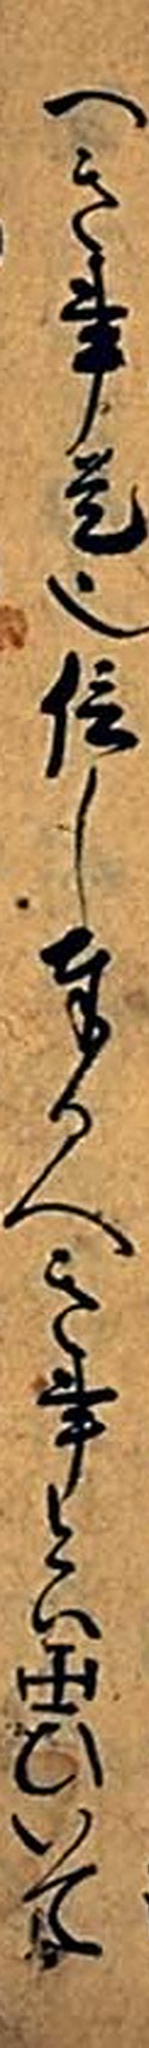へき事是也信し奉るへき事とは☩ひいて
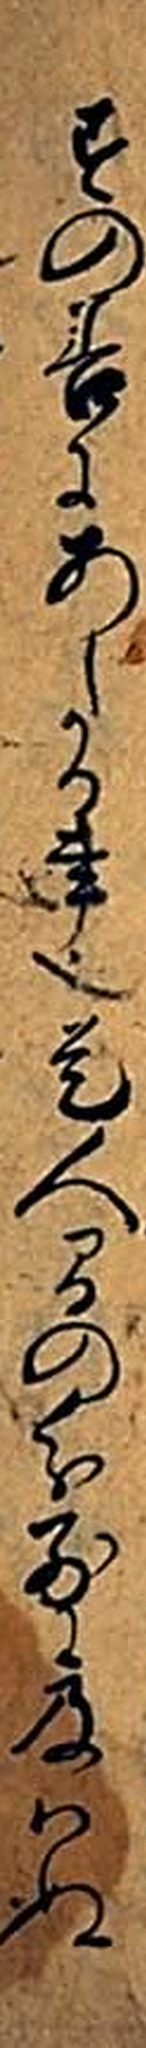すの善にあたる事也是人間の分別に及はぬ
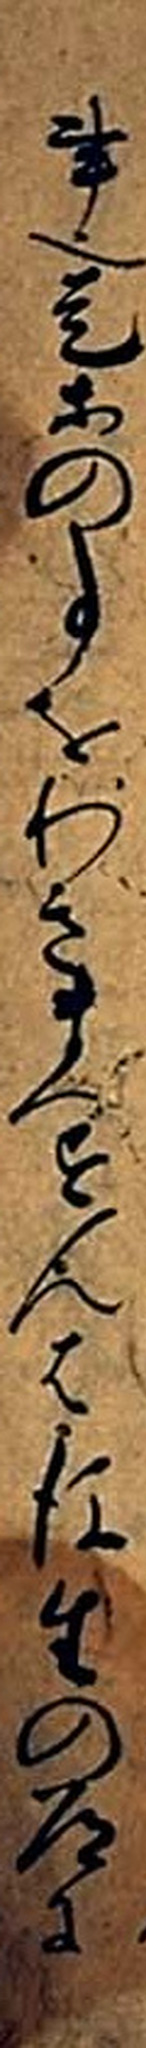事也是等の事をわきまへすんは後生の道に
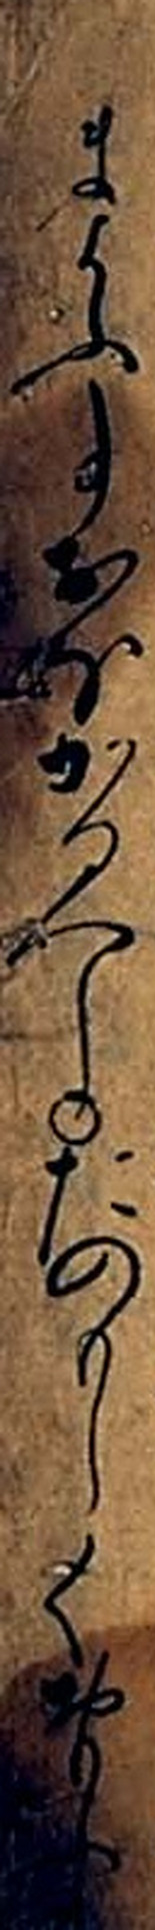まよふ事おほかるへし○たのもしくおも

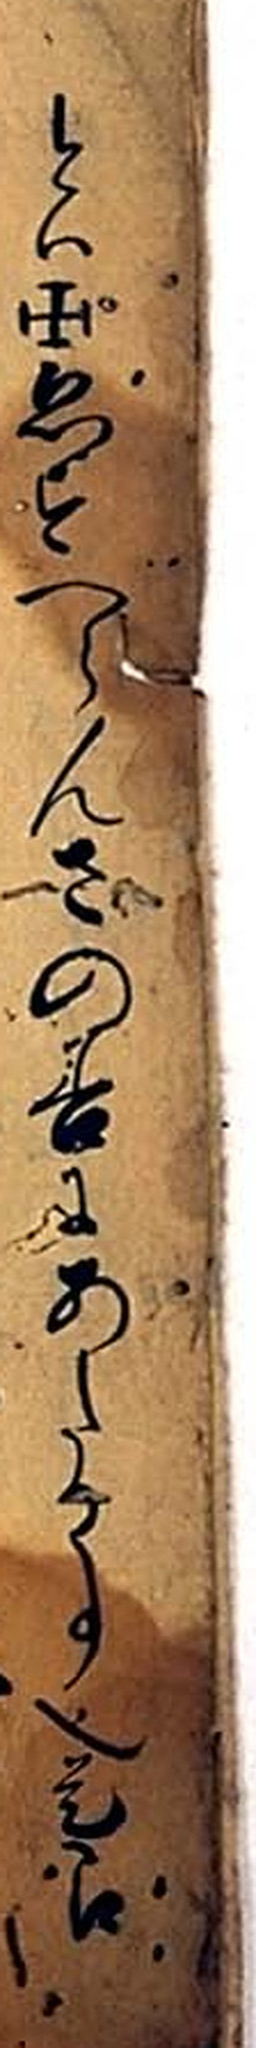とは☩ゑすへらんさの善にあたる事也是即
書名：ドチリナ・キリシタン
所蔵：東京大学総合図書館 / General Library in the University of Tokyo
